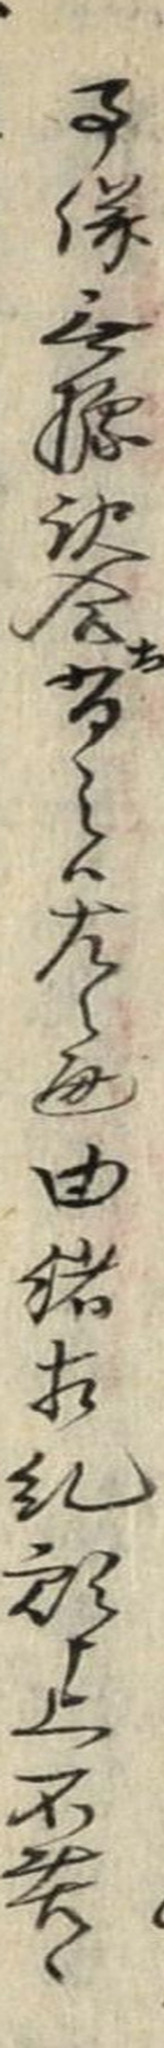事併無拠訳合於有之ハ左之通由緒相糺願申上不苦候
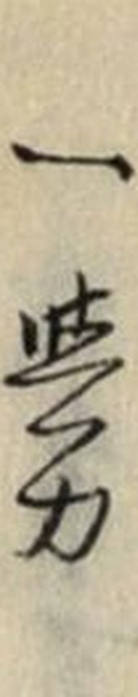一与力
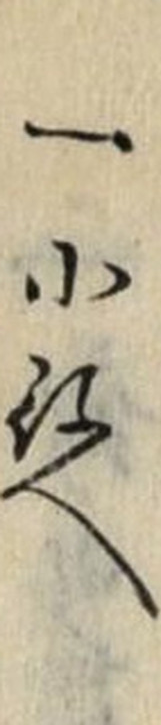一小役人
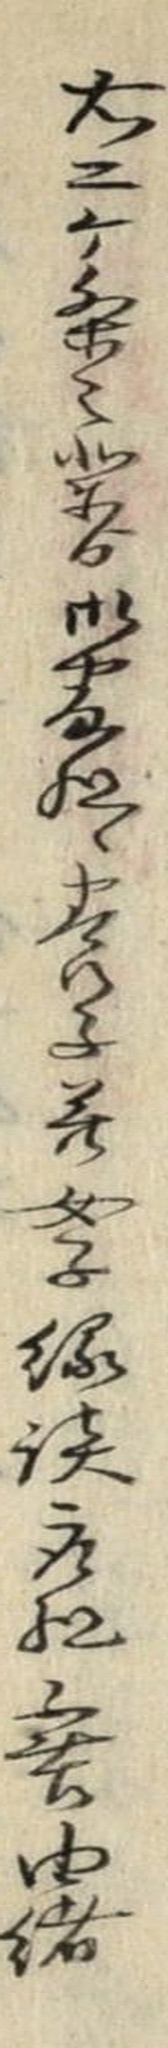右二ヶ条之輩ゟ御番組へ養子并女子縁談取組不苦由緒
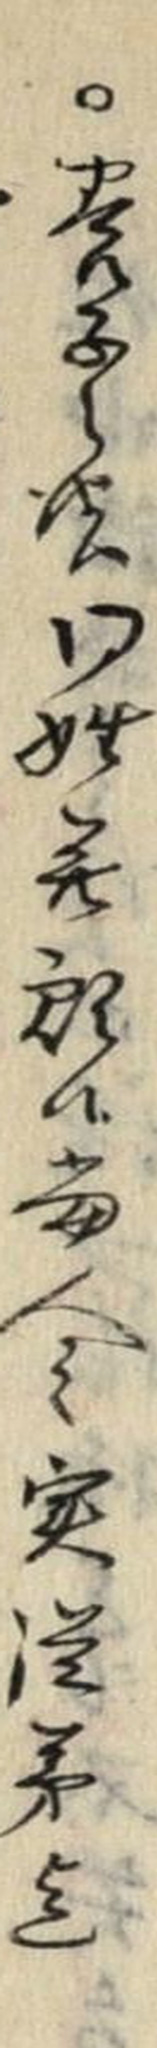○養子之儀ハ同姓并願候当人之実従弟迄
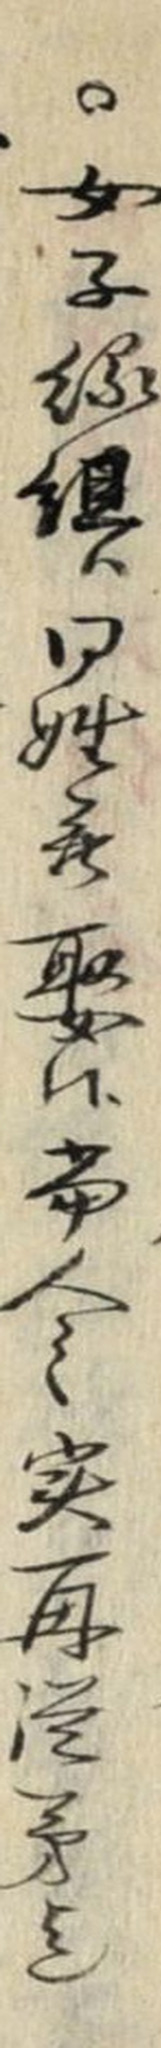○女子縁組ハ同姓并娶候当人之実再従弟迄
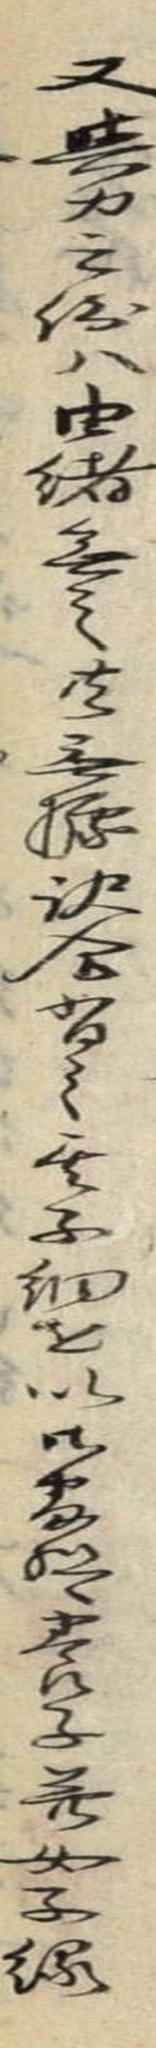又與力之儀ハ由緒無之共無拠訳合有之其子細を以御番組へ養子并女子縁
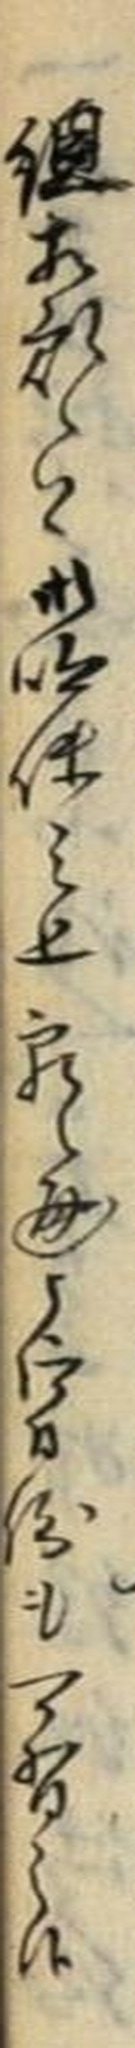組相願候ハヽ御吟味之上願之通被仰付儀も可有之候
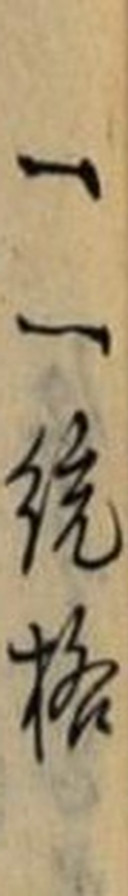一一統格
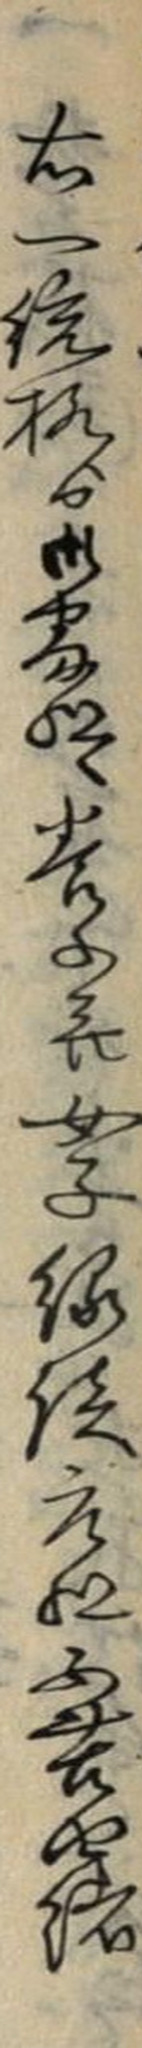右一統格ゟ御番組ヘ養子并女子縁談取組不苦由緒
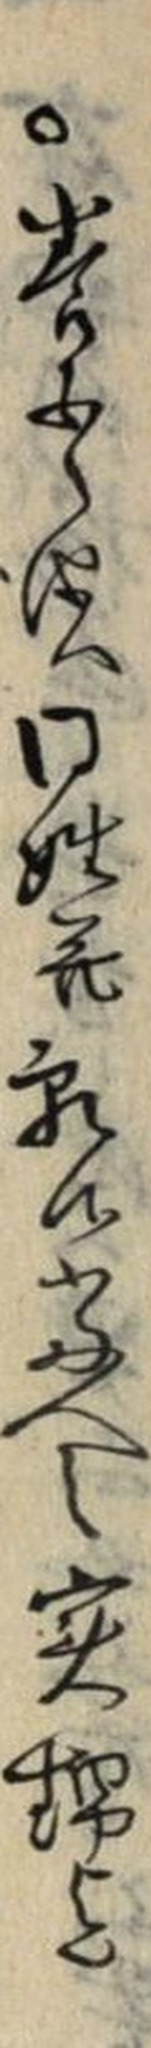○養子之儀ハ同姓并願候当人之実甥迄
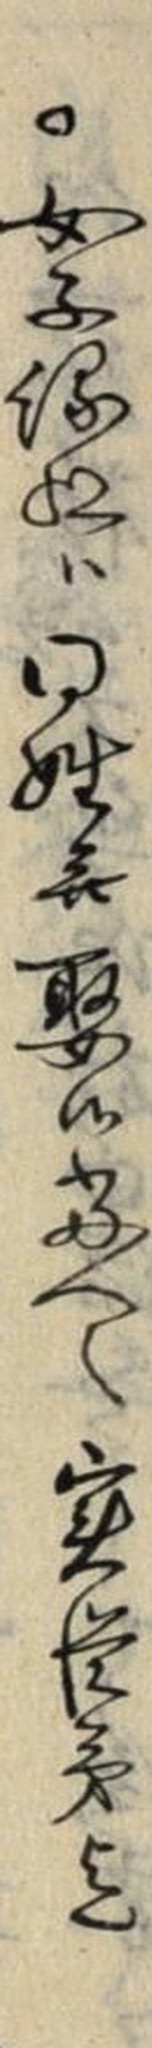○女子縁組ハ同姓并娶候当人之実従弟迄
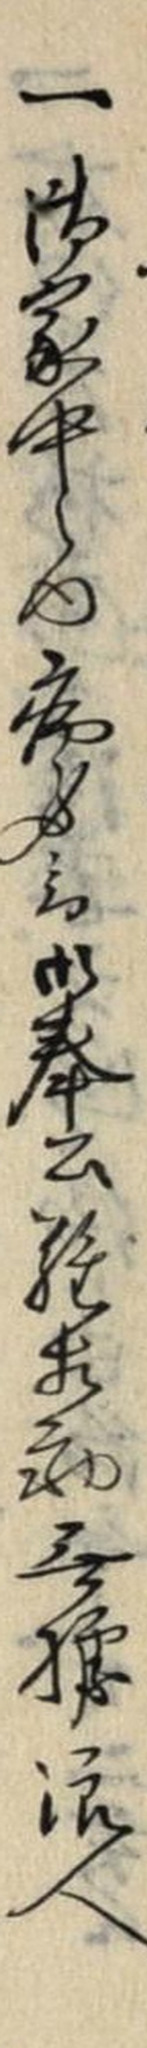一御家中之内病身ニ而御奉公難相勤無拠浪人
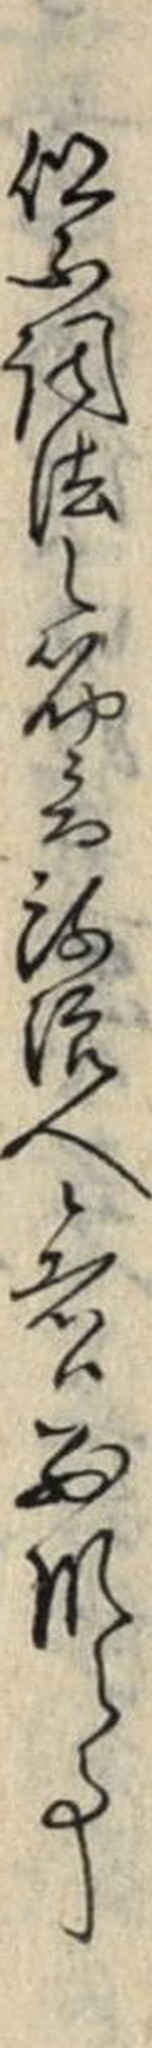但不調法之筋ニ而致浪人候者ハ別段之事
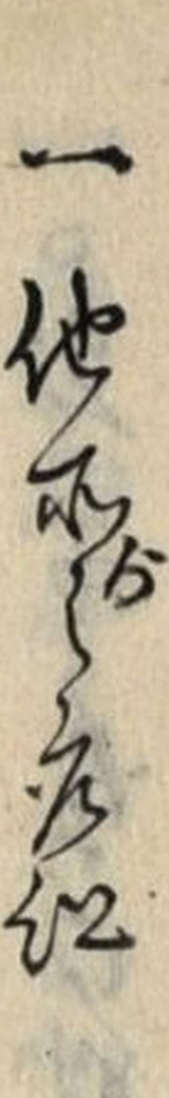一他所ゟ之取組
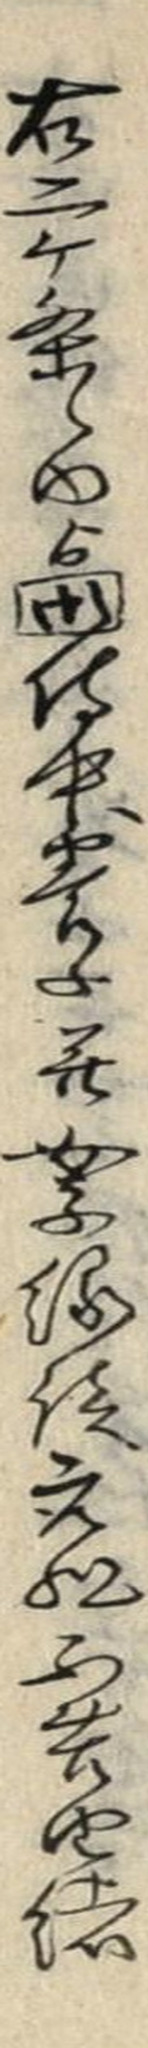右二ヶ条之輩ゟ御番組へ養子并女子縁談取組不苦由緒
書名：養子縁組之部
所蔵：福井県文書館 Fukui Prefectural Archives
